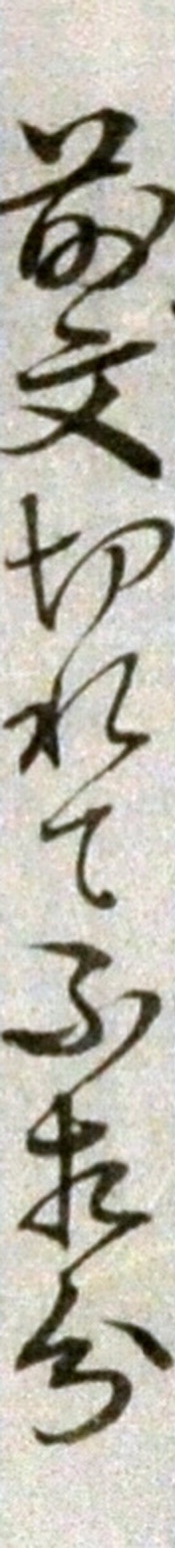前文切れて不相分
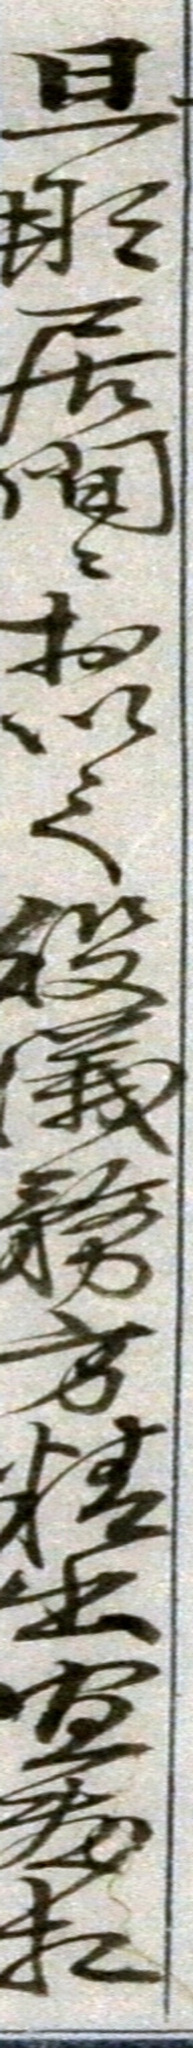旦那居間ニおいて役儀務方精出宜敷相
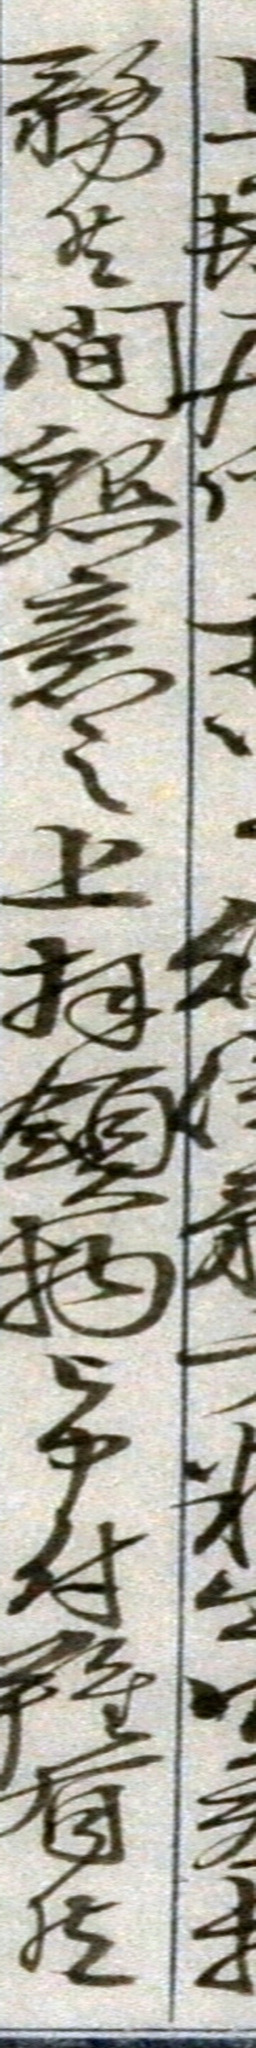務候間懇意之上拝領物被申付難有候
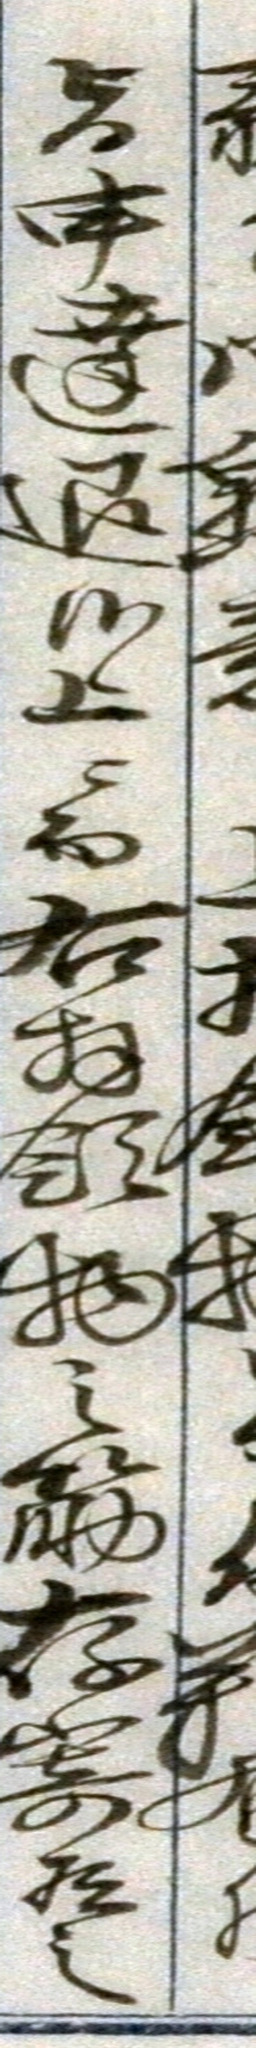旨申達退候上ニ而右拝領物之筋存寄候之
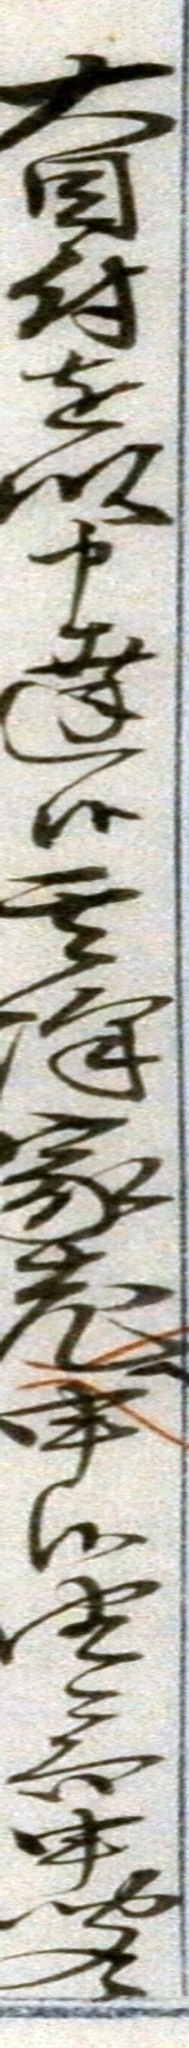大目付を以申達候其訳家老へ申候由ニ而申聞候
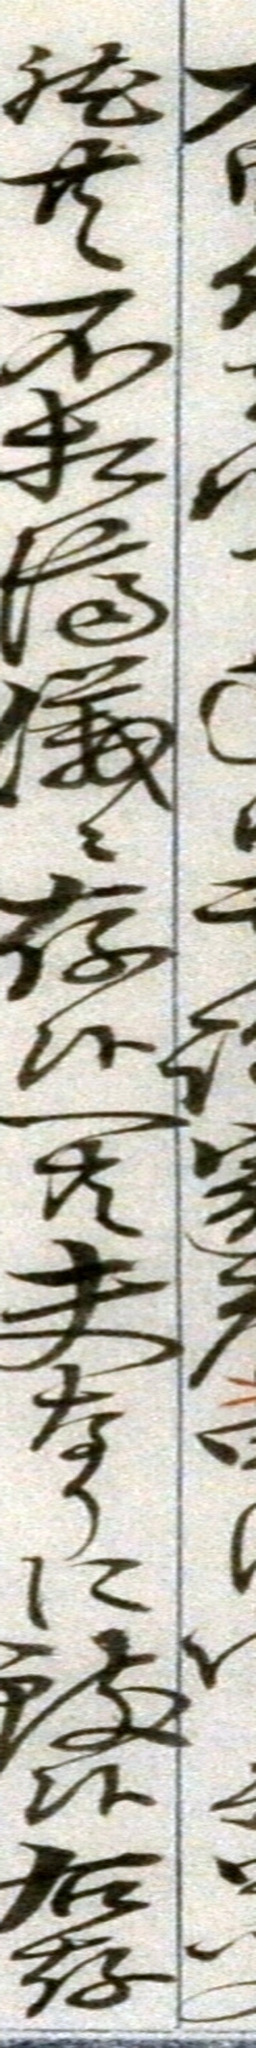然共不相済儀ニ存候ヘ共夫なりに致候右存
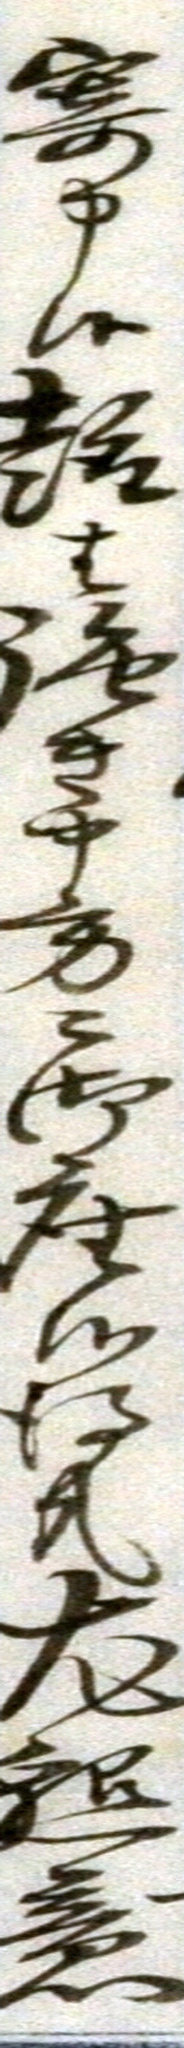寄申候趣は強き申方ニ御座候得共尤懇意
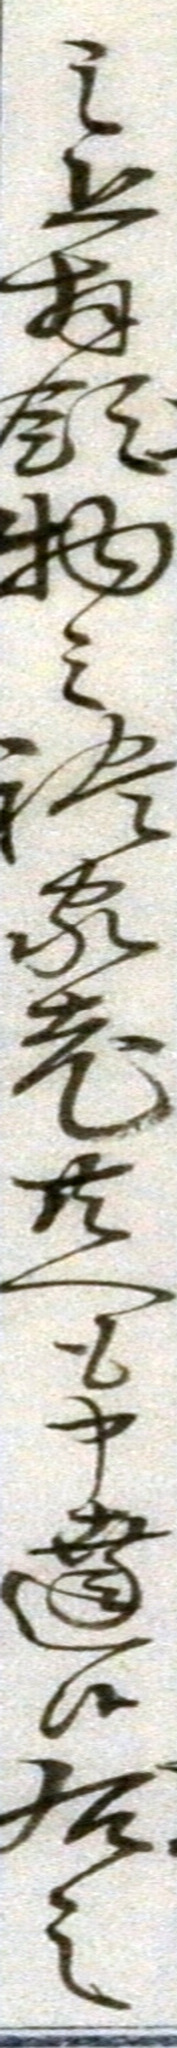之上拝領物之礼家老共へも申達候右之
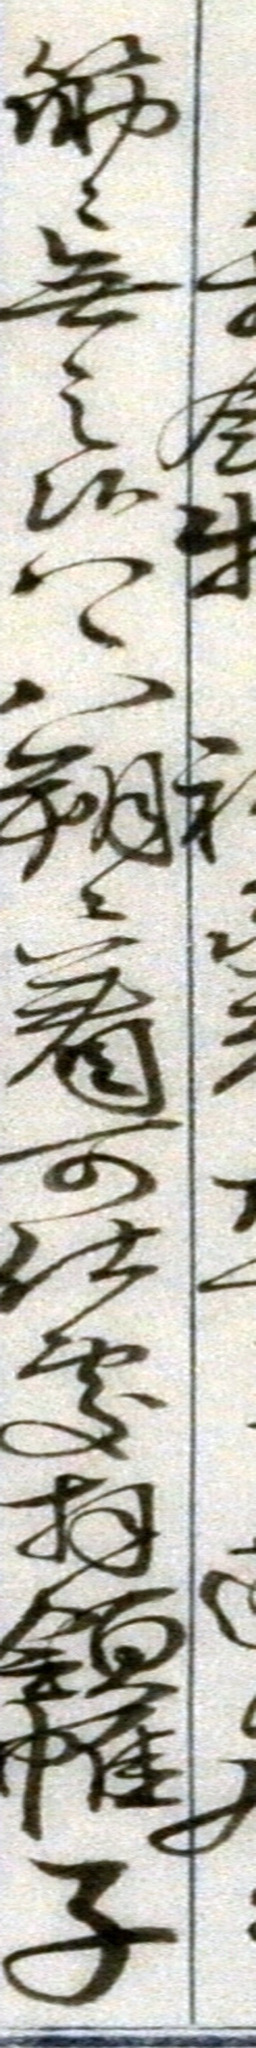筋ニ無之候ハヽ八朔ニ着可仕処拝領帷子
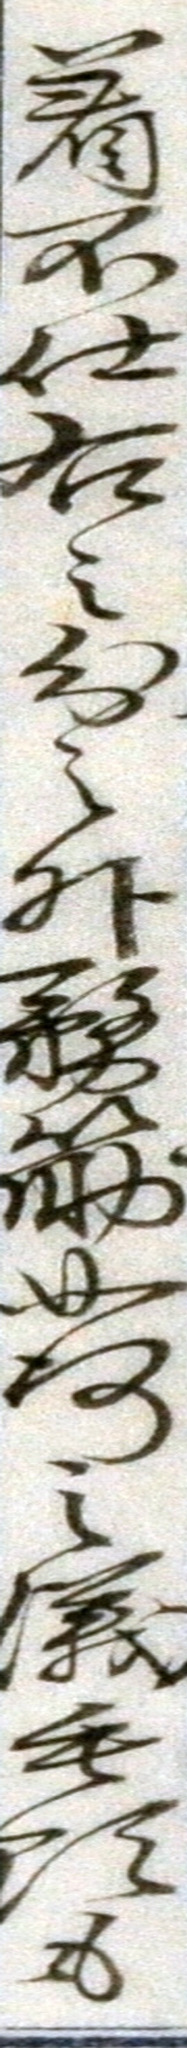着不仕右之分之外務筋如何之儀毛頭も
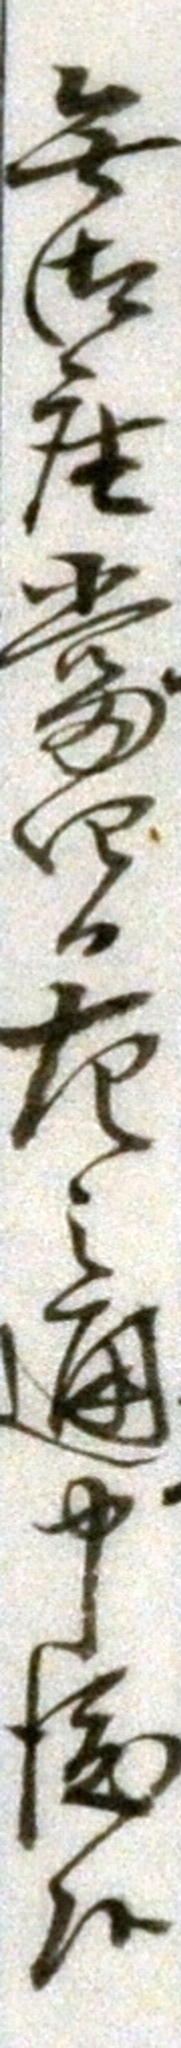無御座当四日左之通申渡候
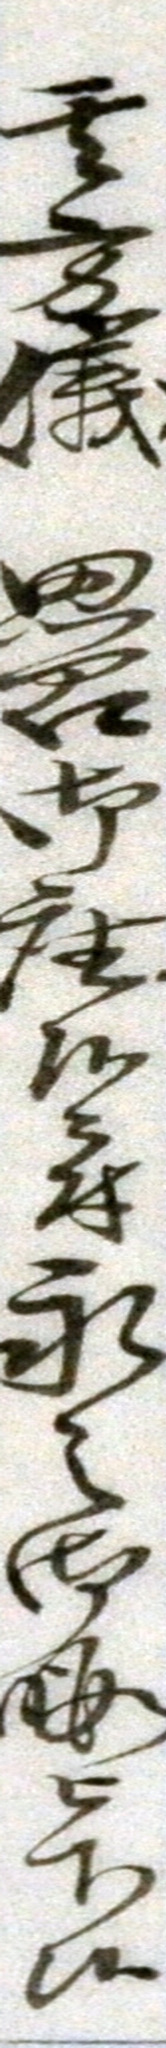其方儀思召御座候ニ付永之御暇被下候
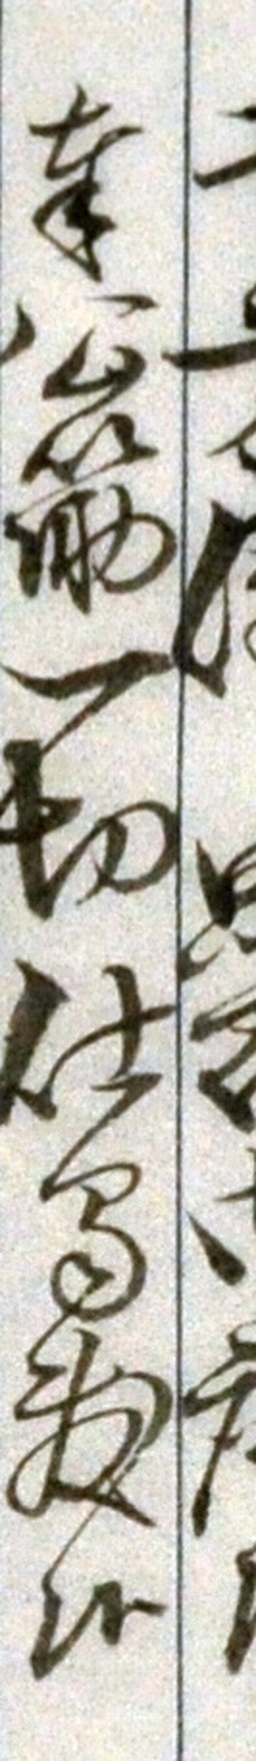奉公筋一切仕間敷候
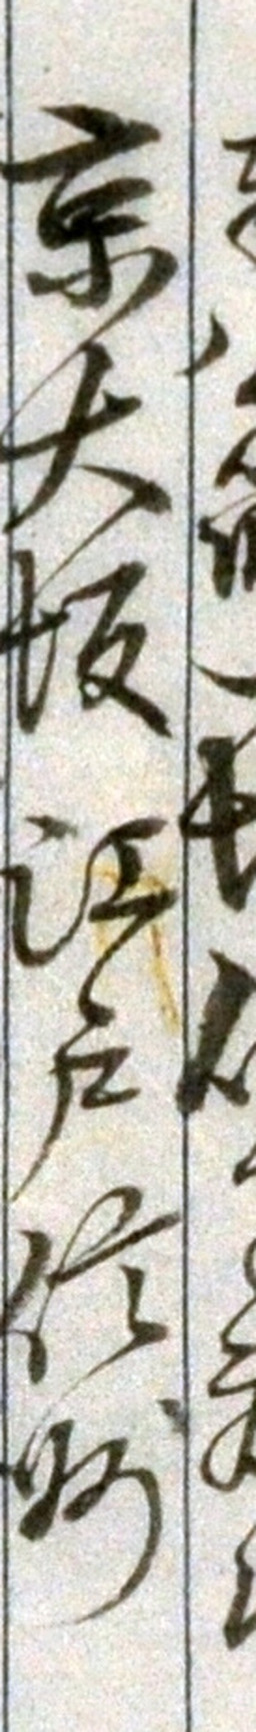京大坂江戸信州
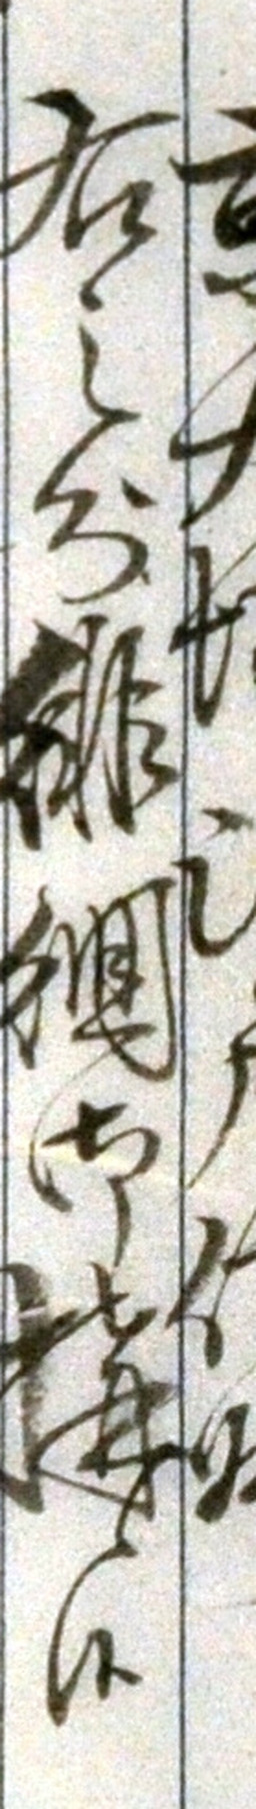右之分徘徊御構候
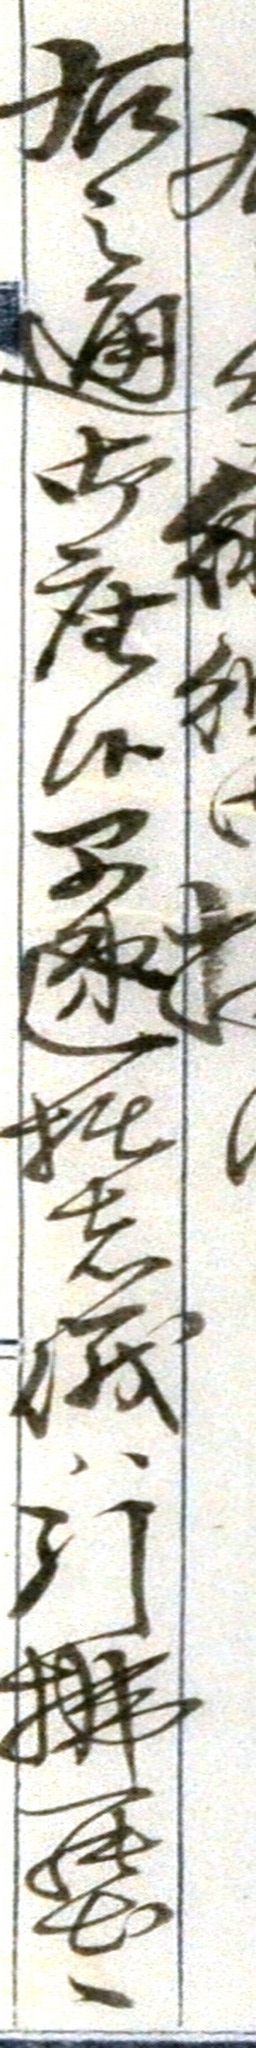右之通御座候早速拙者儀ハ引払罷出候
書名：三好氏先代以来勤仕録、池田丈介一家勤仕録
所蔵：伊那市立高遠町図書館・合同会社AMANE
